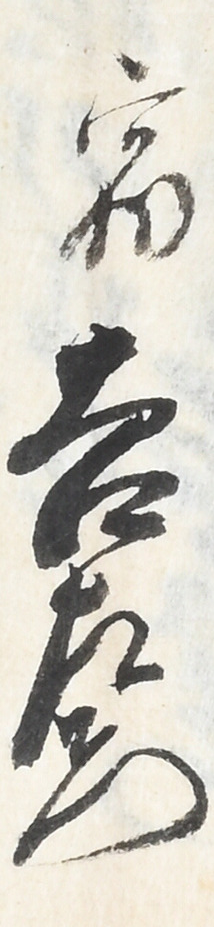宿友右衛門
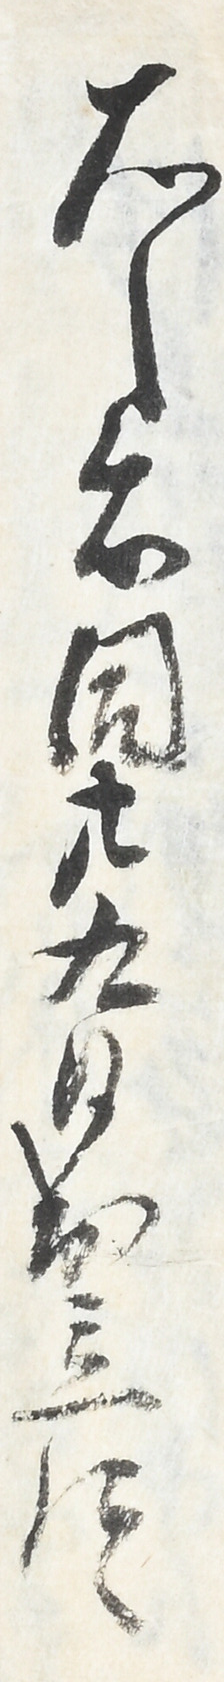右之者同八日出立仕候
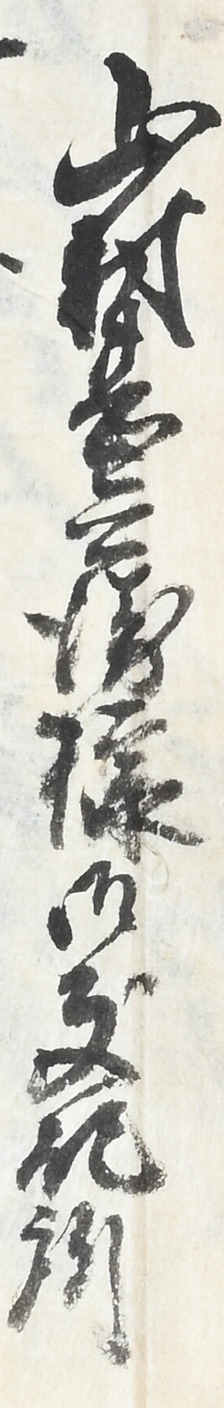山村甚兵衛様御支配所

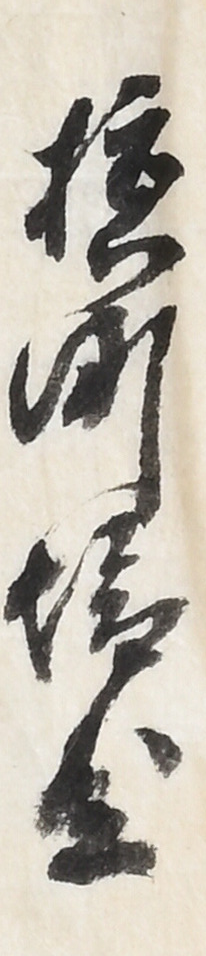横町塩屋
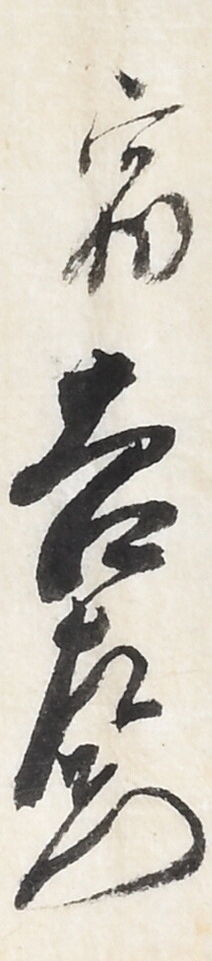宿吉左衛門
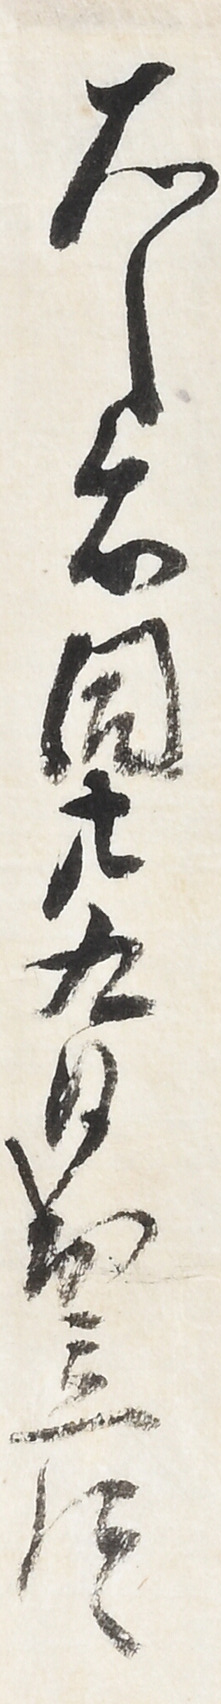右之者同廿九日出立仕候
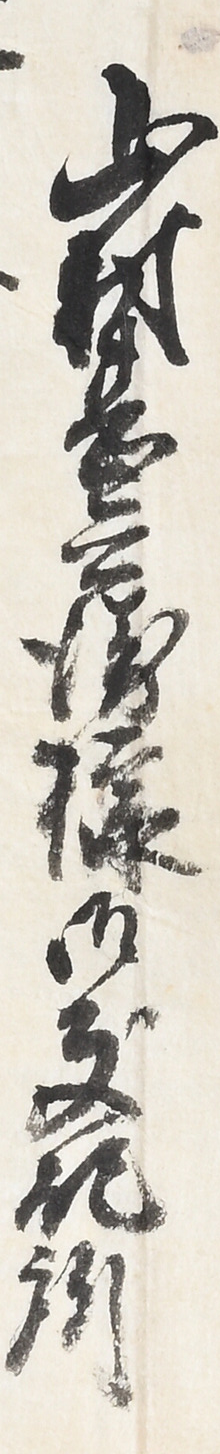山村甚兵衛様御支配所
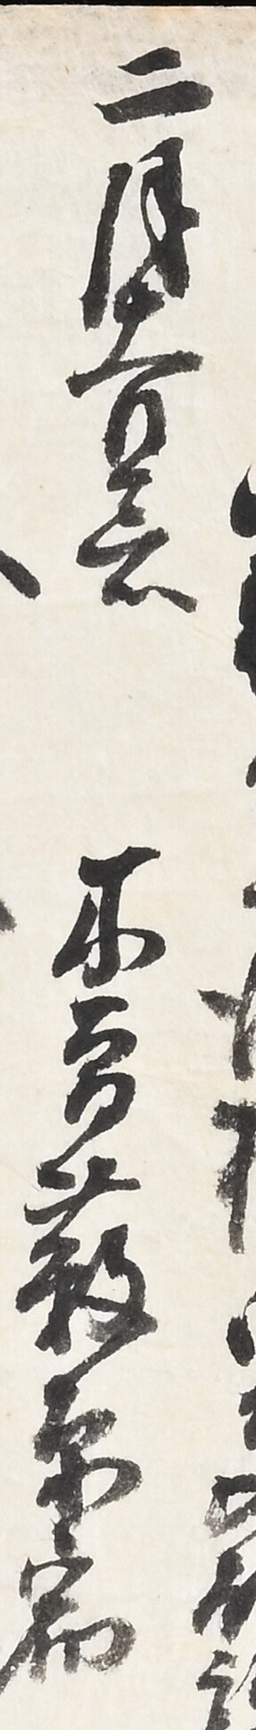二月十一日着木曽萩原宿
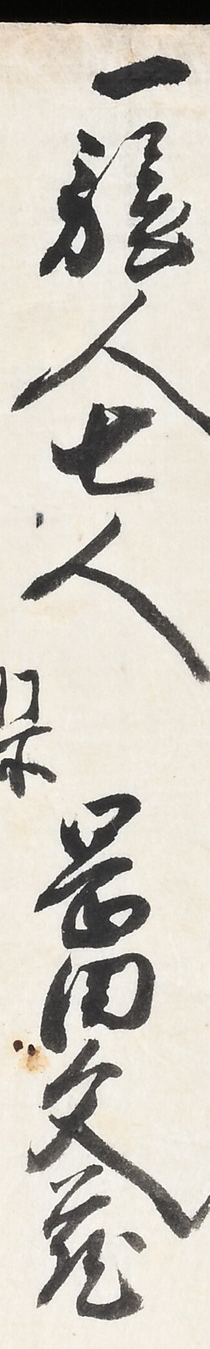一旅人七人岡田文蔵
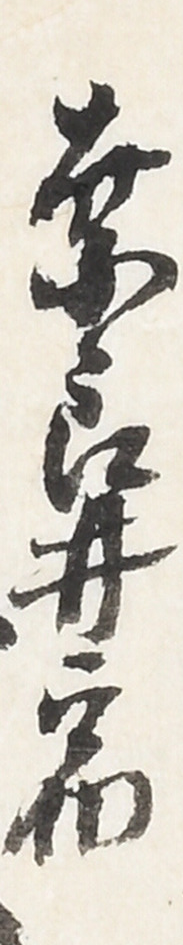奈良井宿
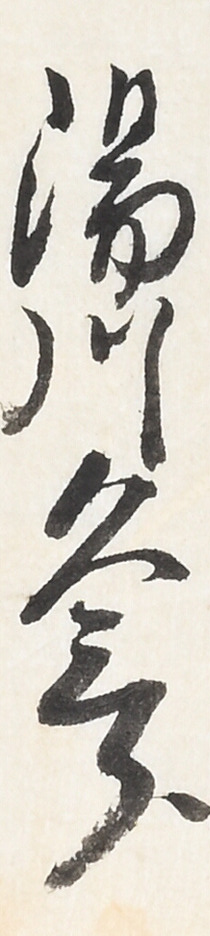湯川久三郎
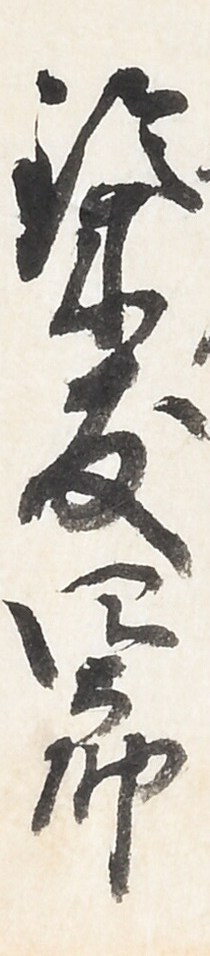鈴木友四郎
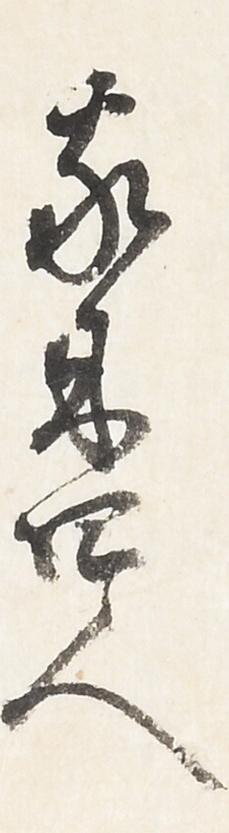家来四人
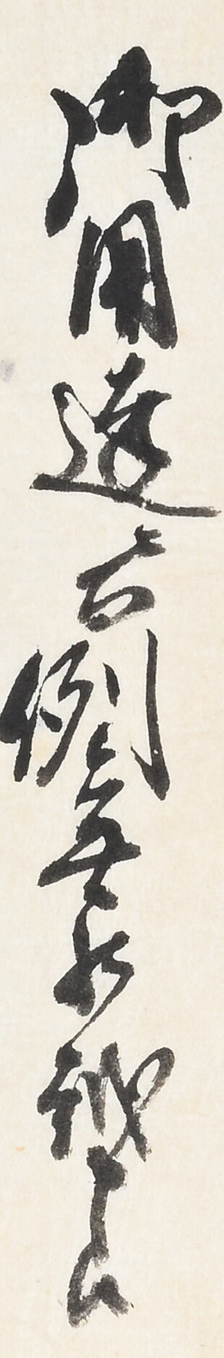御用達ニ而例年罷越申候
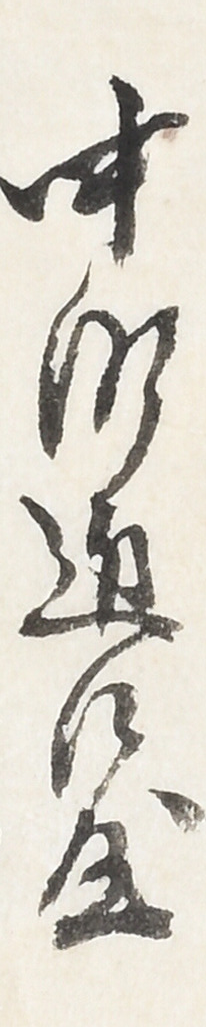中町近江屋
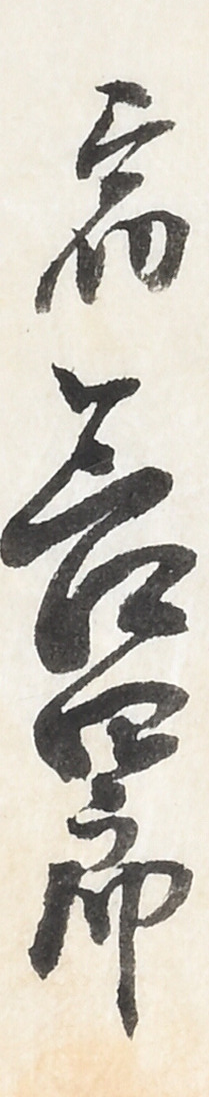宿善四郎
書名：旅人泊控帳
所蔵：伊那市立高遠町図書館・合同会社AMANE
